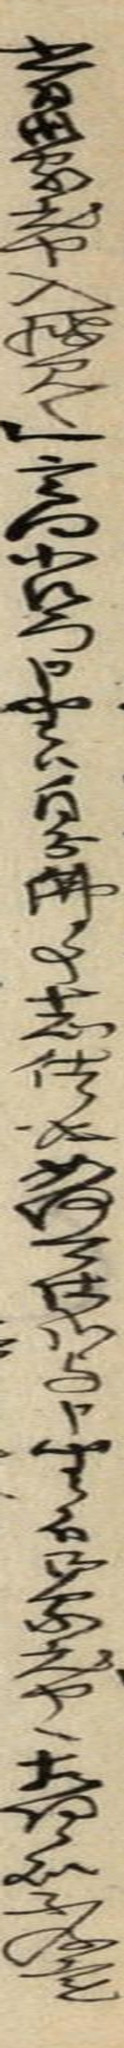書付御家老中入披見之」高田小左衛門申聞候は自分仏事志仕候儀如何可仕哉と申聞候に付御家老中へ相伺候処不及遠
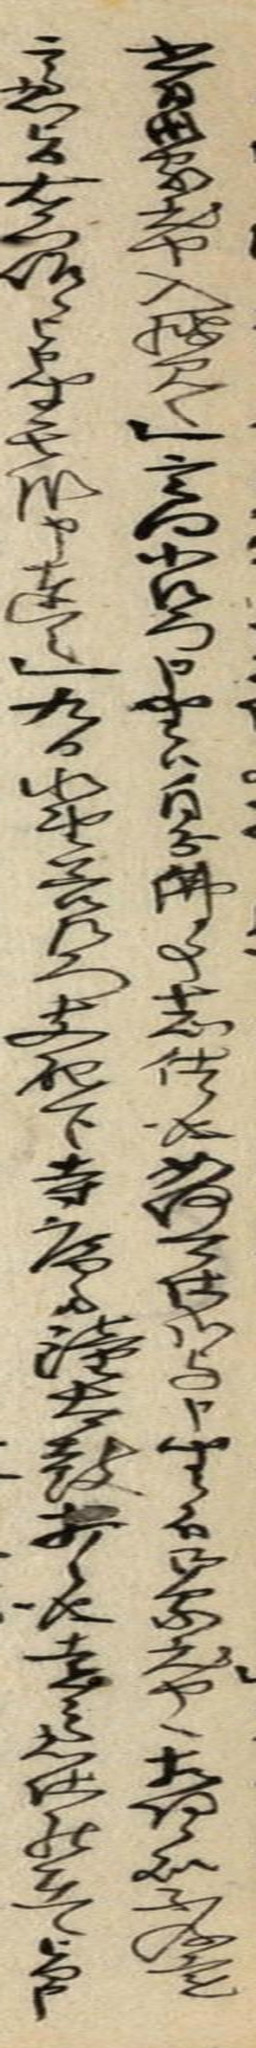慮旨右衛門作へ被申聞其段申達之」九日水野善左衛門支配下寺庵方鐘太皷打之儀遠慮仕罷在候旨申
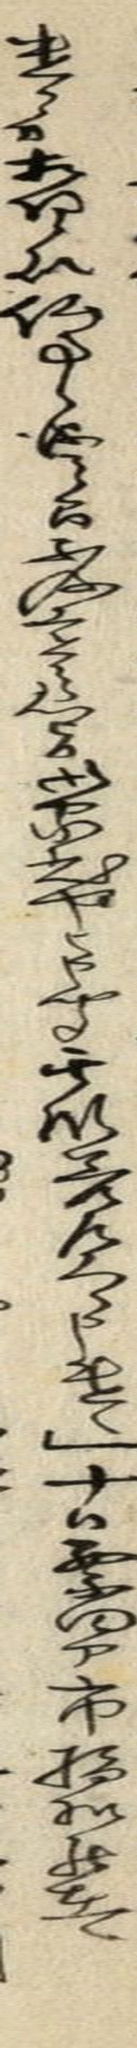遣候に付相伺候処仏事之儀に候間不及遠慮旨御家老中被申聞其段善左衛門へ申遣候」十日粟田部市指扣罷在候
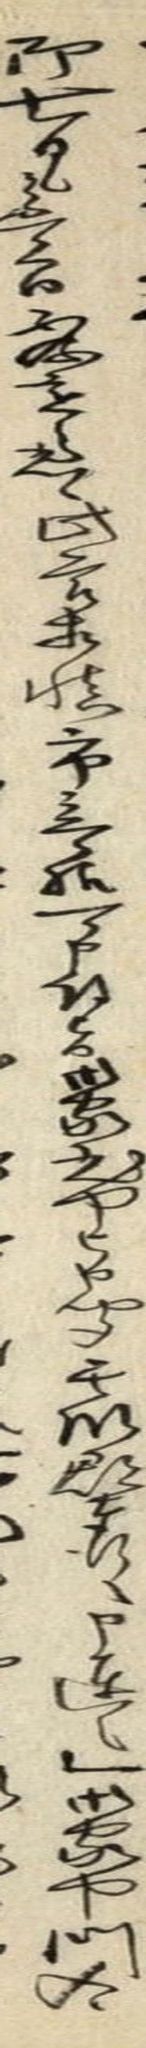御七日も過候間不及遠慮候此節相慎市立候様可申付旨御家老中被申聞其段郡奉行へ申達之」御家中門〆候
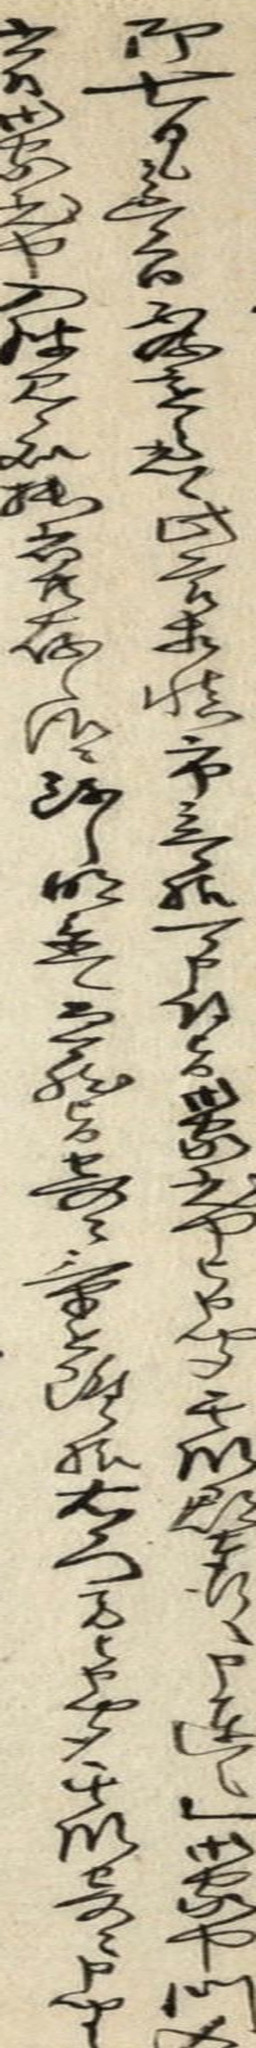書付御家老中入披見候処拙者共存候趣に致し明置候て可然旨寄々気を附候様右衛門方被申聞其段寄々申聞候
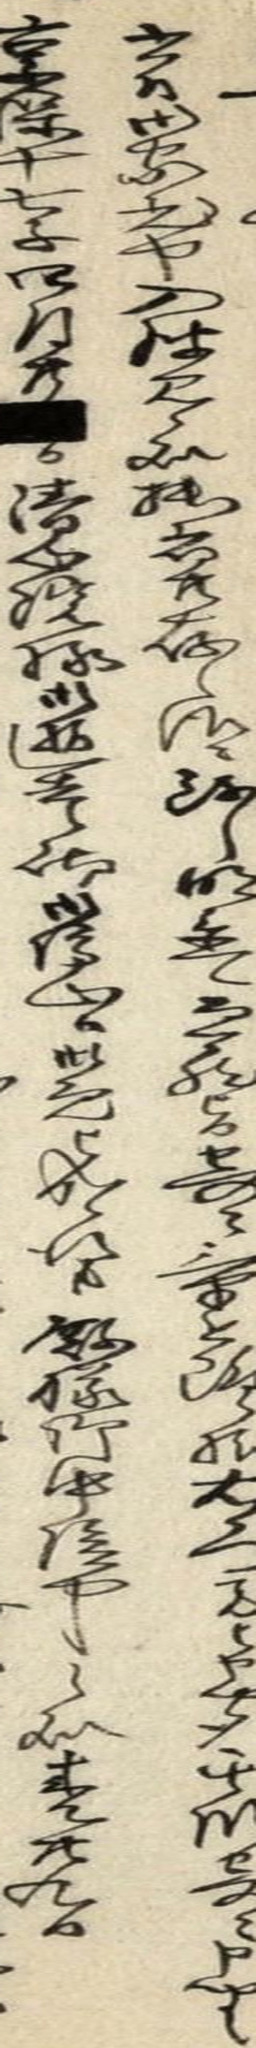一享保十七子四月廿日清心院様御逝去之砌御停止は御免被成候得共殿様御中陰中之処来ル廿九日
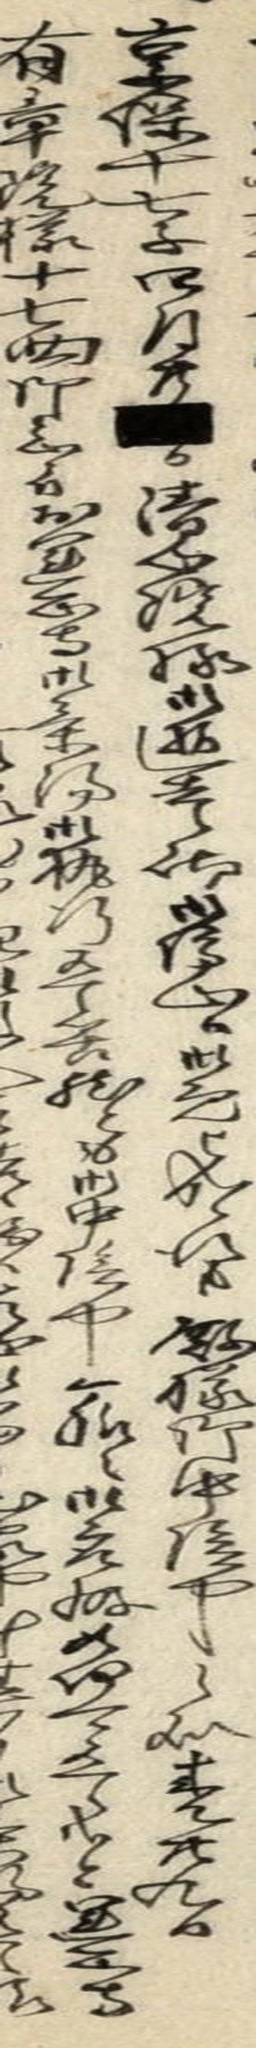有章院様十七回御忌に付於運正寺御茶湯御執行有之筈然とも御中陰中ケ様之御取扱如何可有之哉と運正寺
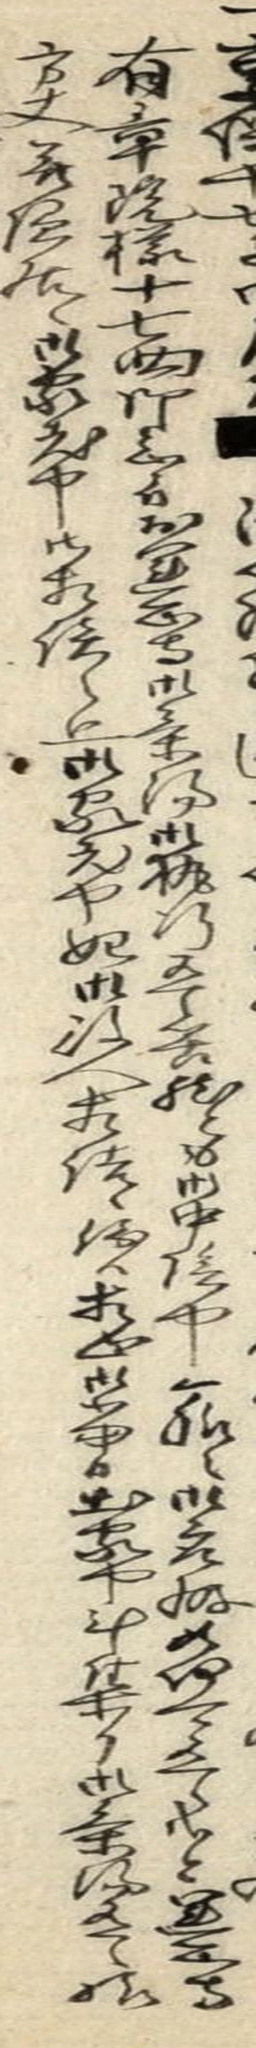方丈并隠居へ御家老中御相談之上御家老中始御役人中相詰候儀は相止御当日出家中斗集り御茶湯有之様
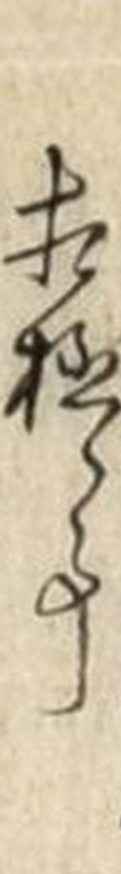相極候事
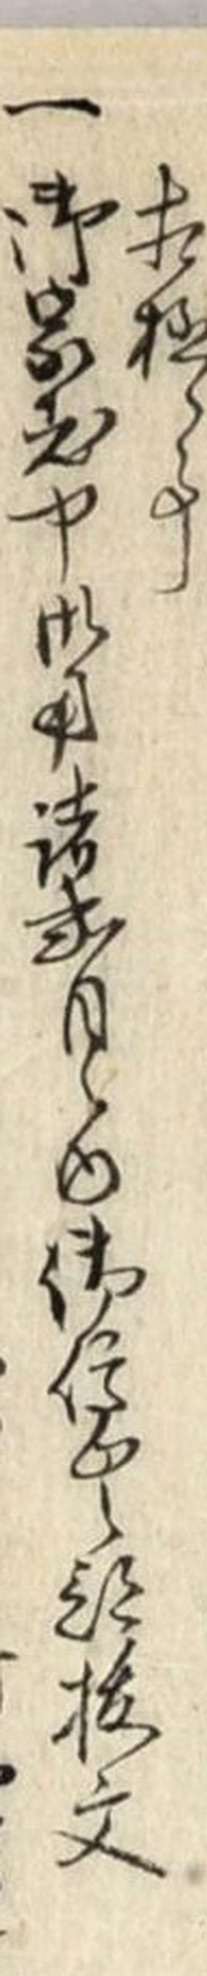一御家老中御用諸式月之内御停止之部抜文
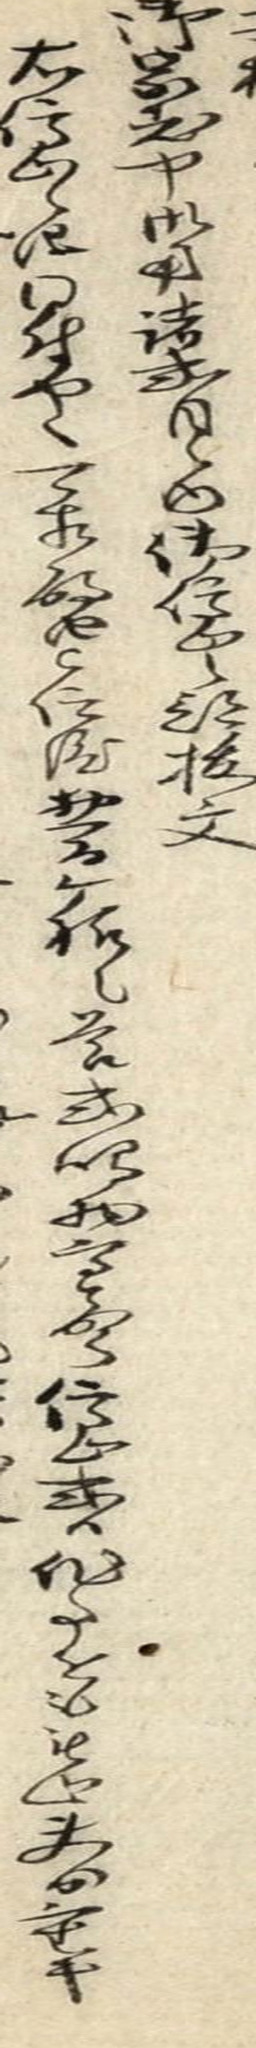右停止之儀目付中へ可相触由被仰渡惣てケ様之節或鳴物高声停止或は作事をも被止夫ゟ重キ
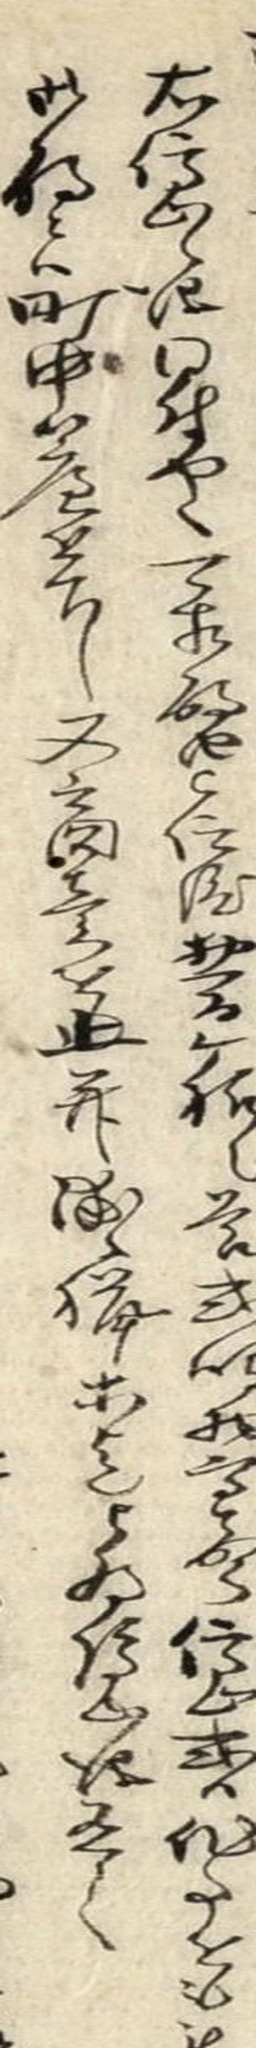御触には町中簾を下し又商売を止并浦々猟等迄被為停止儀有之
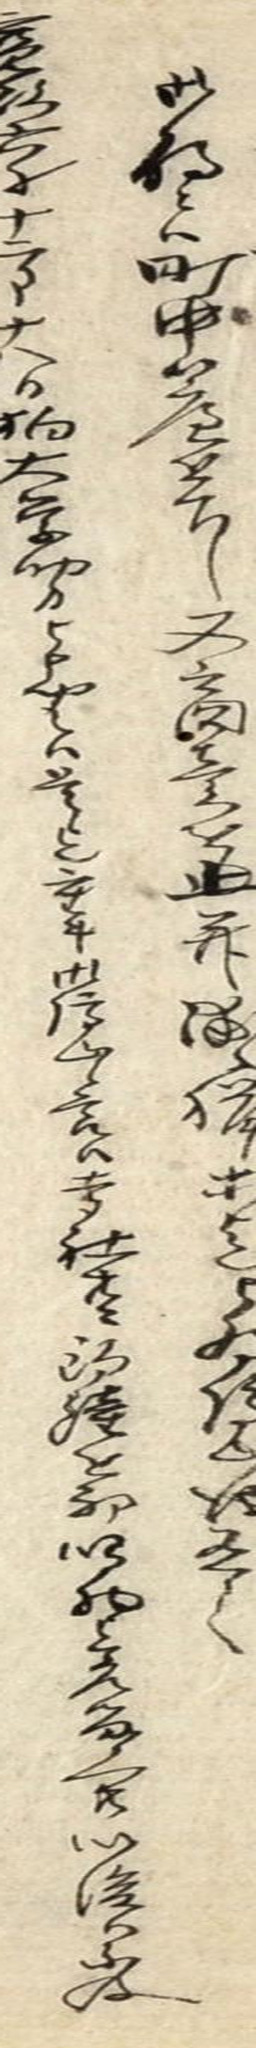一寛政六刁十二月十八日狛大学助方被申聞候は是迄重キ御停止之節は寺社共に釣鐘を初鳴物被差留候へ共以後は不及
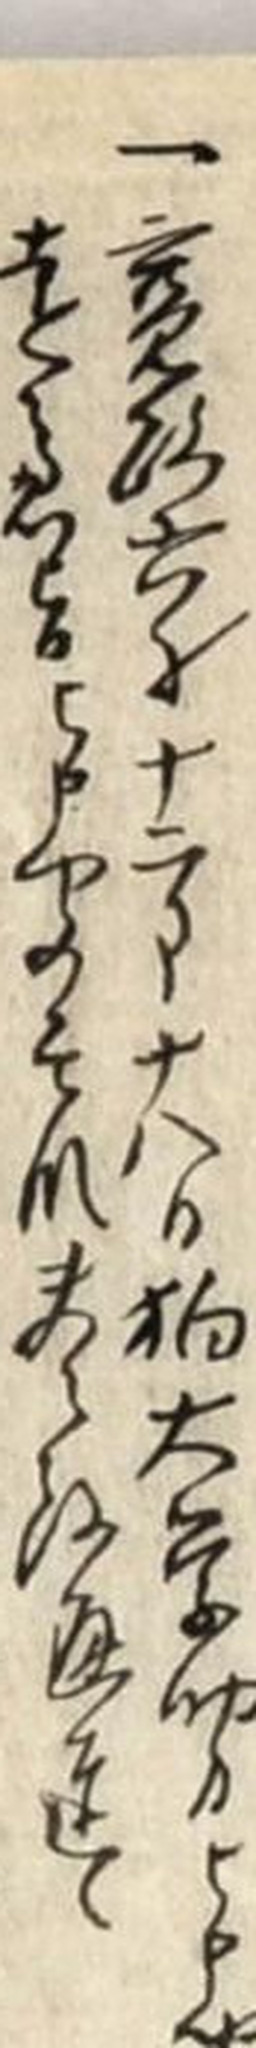遠慮旨被申聞其段夫々致通達候
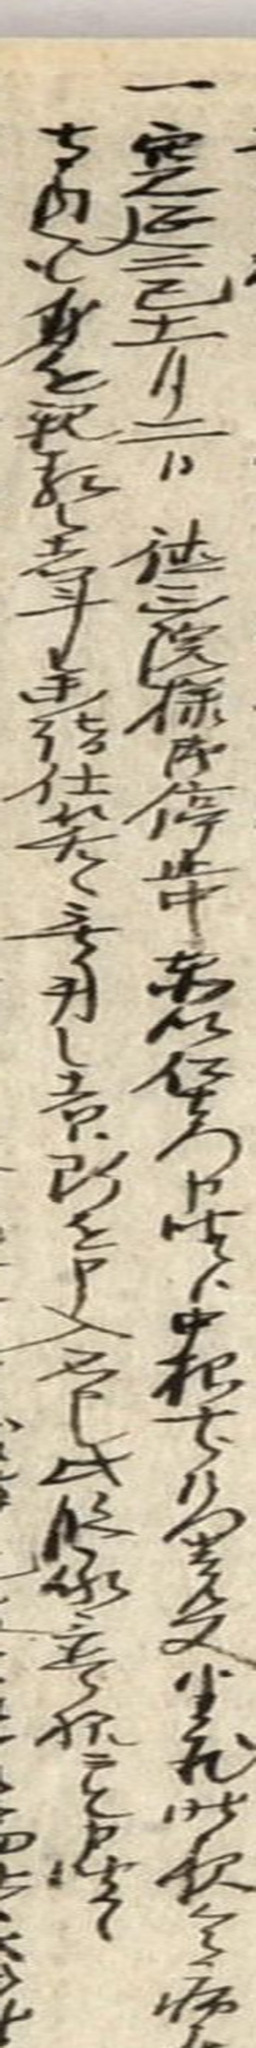寺内へも身近親類之者斗参詣仕筈候無用之者は断を申入不申候此段承置候様にと申聞候
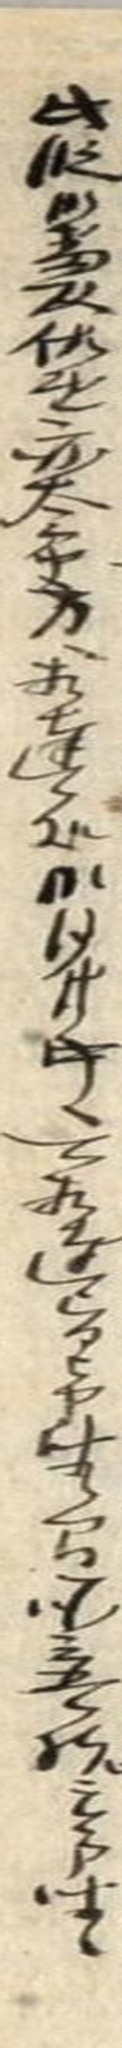此段御番頭佐野亦太郎方へ相達候処御目付中へ可相達旨被申聞候間所置候様にと申聞候
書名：御停止異変死失
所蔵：福井県文書館 Fukui Prefectural Archives
